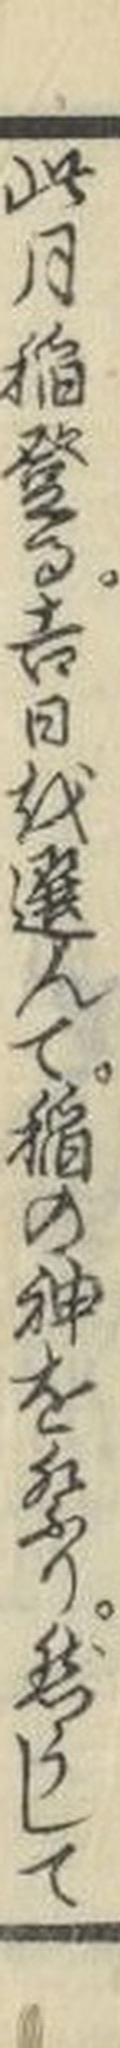此月稲登る。吉日を選んて。稲の神を祭り。然うして
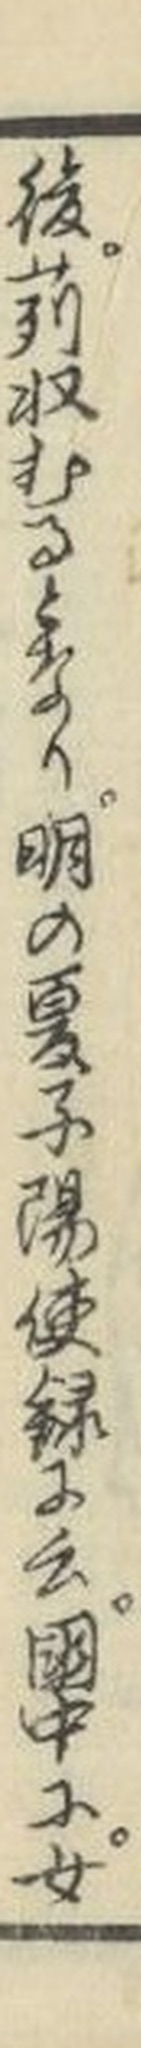後。茢収むるとなり。明の夏子陽使録に云。国中に。女
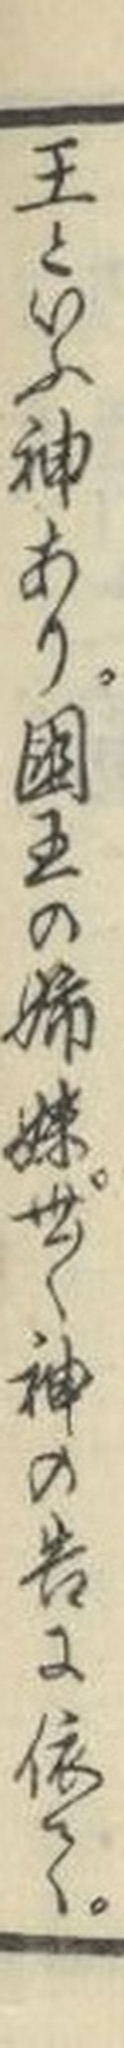王といふ神あり。国王の姉妹。世〳〵神の告に依て。
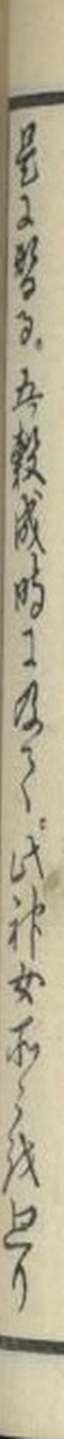是に替る。五穀成時に及て。此神女所々を廻り
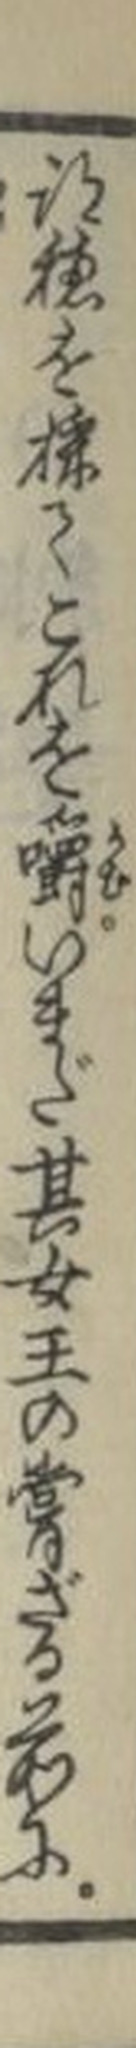行穂を探てこれを嚼。いまだ其女王の嘗ざる前に。
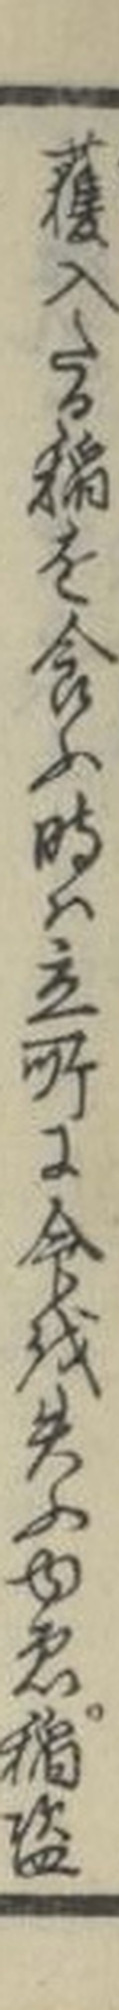穫入たる稲を食ふ時は立所に命を失ふゆゑ。稲盗
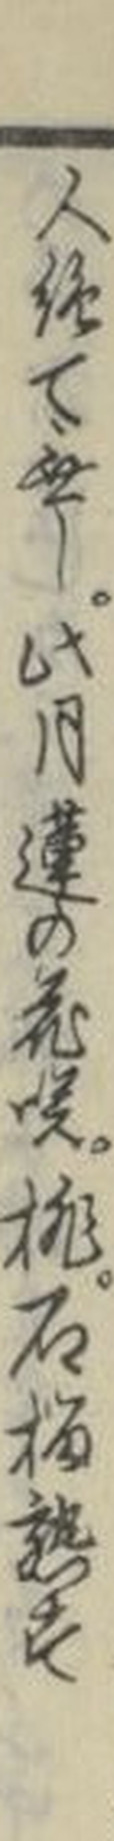人絶て無し。此月蓮の花咲。桃。石榴熟す
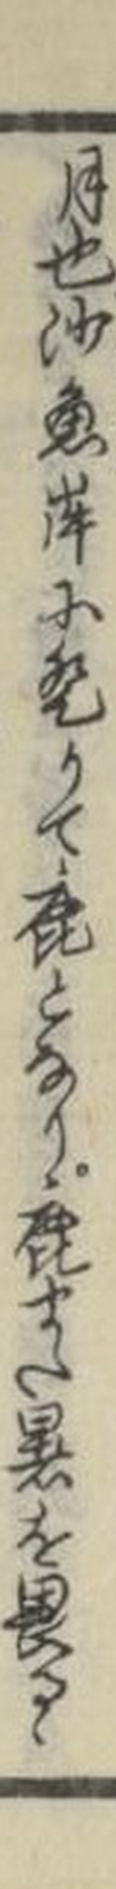月也。沙魚。岸に登りて鹿となり。鹿また暑を畏るゝ
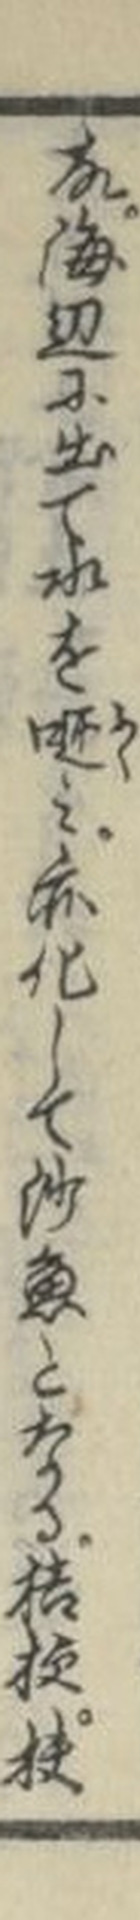故。海辺に出て水を咂み。亦化して沙魚となる。桔梗。扶
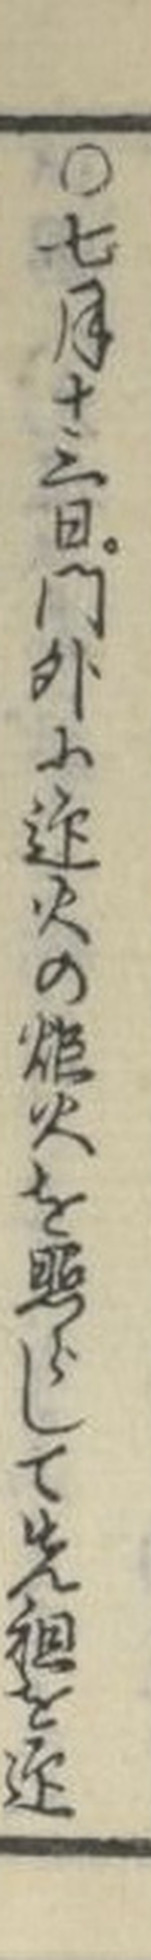○七月十三日。門外に迎火の炬火を照らして先祖を迎
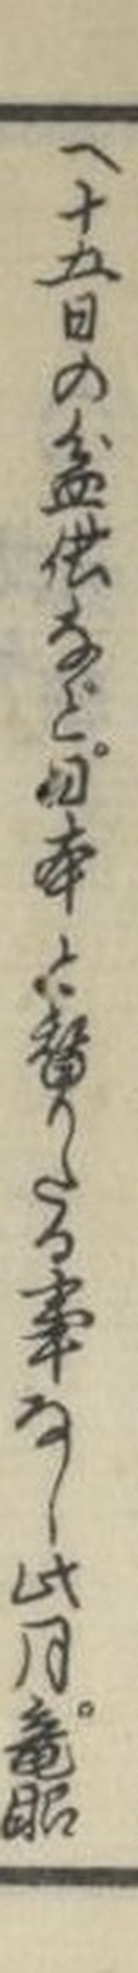へ十五日の盆供など。日本と替りたる事なし此月。竜眼
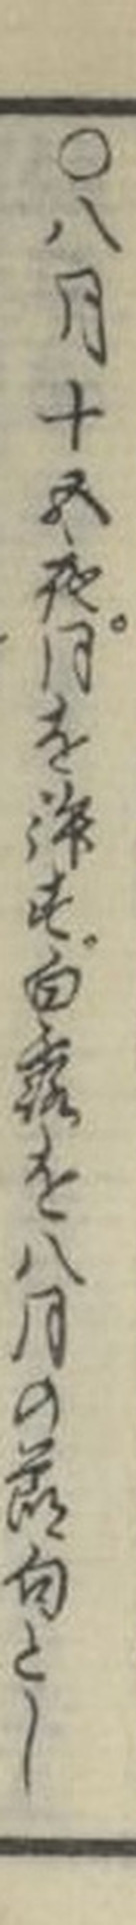○八月十五夜。月を拝す。白露を八月の節句とし
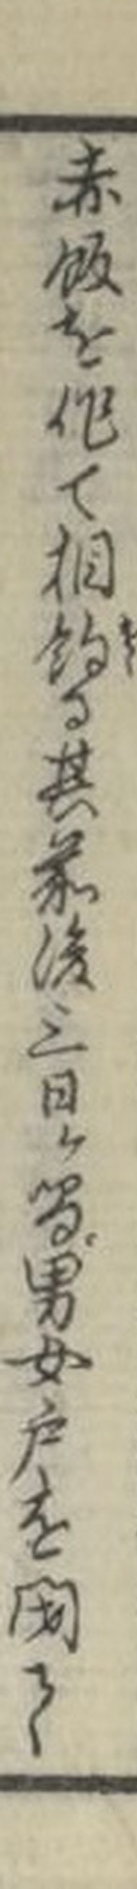赤飯を作て相餉る其前後三日ヶ間。男女戸を閉て
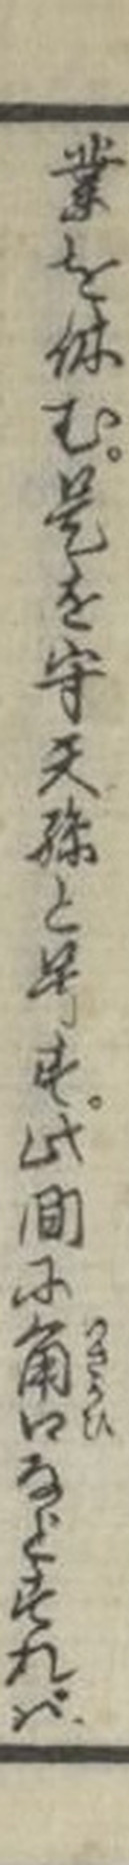業を休む。是を守天孫と号す。此間に角口などすれば
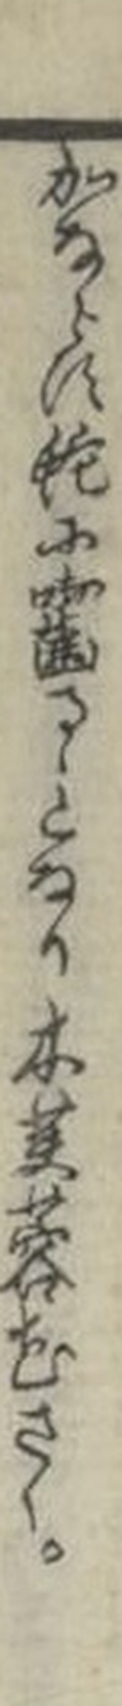かならす蛇に囓るゝとなり木芙蓉花さく。
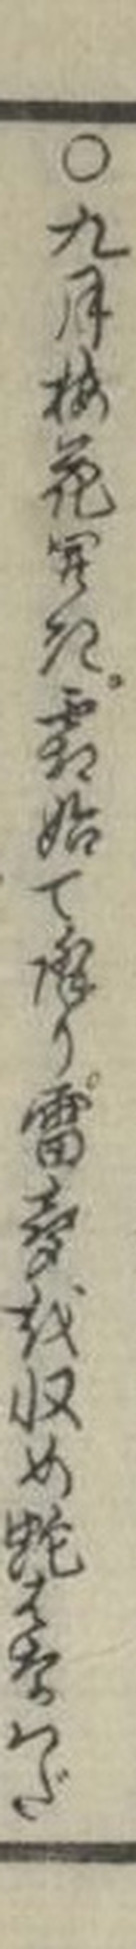○九月梅花開き。霜始て降り。雷声を収め蛇はなはだ
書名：琉球解語
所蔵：University of the Ryukyus Library
